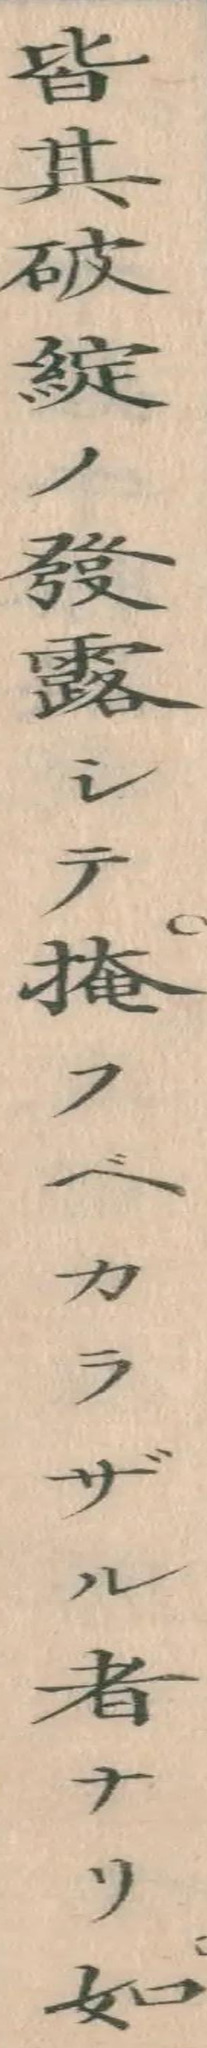皆其破綻ノ発露シテ。掩フベカラザル者ナリ。如
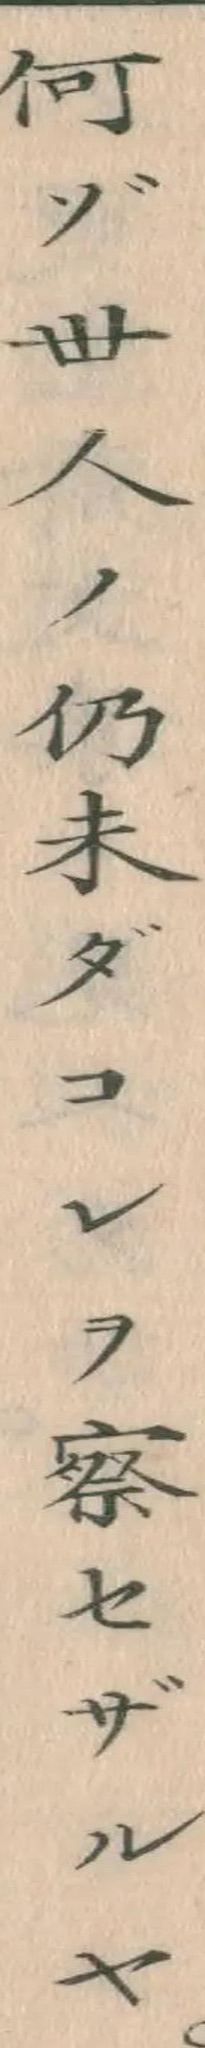何ゾ世人ノ仍未ダコレヲ察セザルヤ。
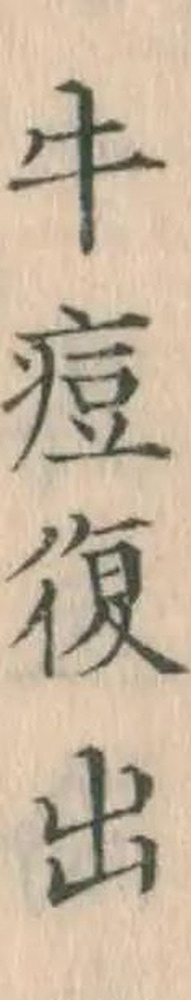牛痘復出
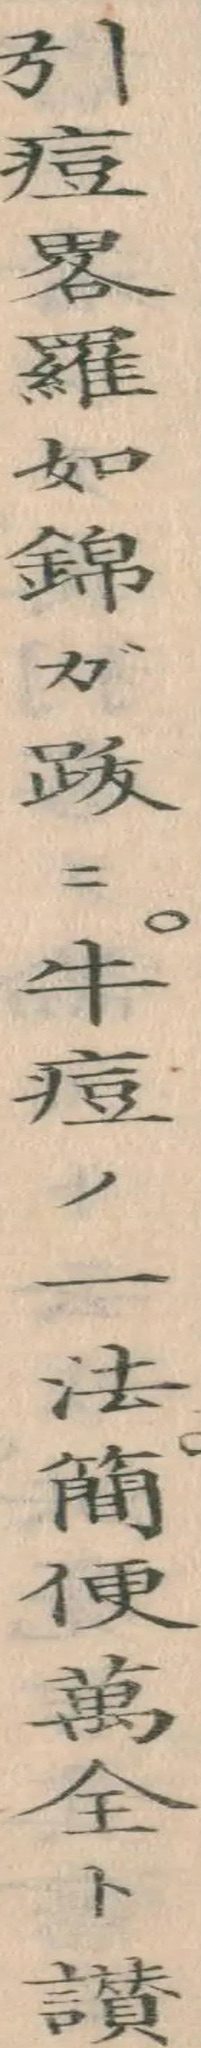引痘略羅如錦ガ跋ニ。牛痘ノ一法。簡便万全ト讃
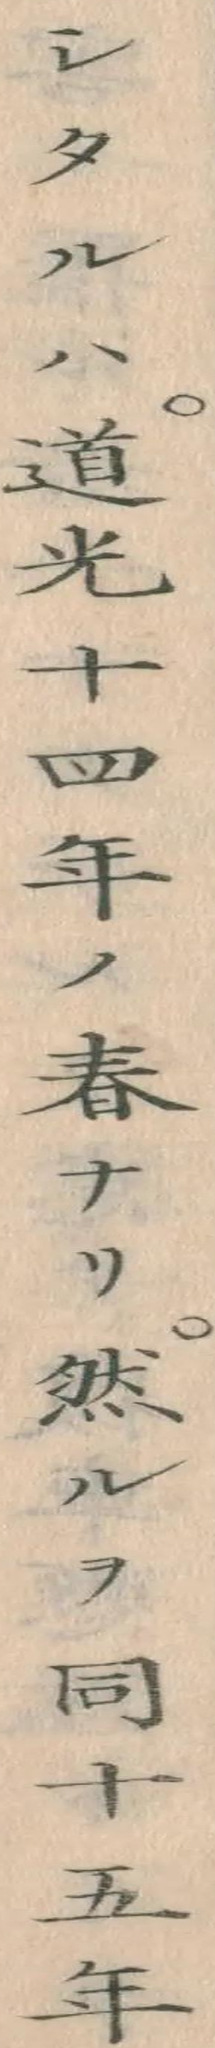シタルハ。道光十四年ノ春ナリ。然ルヲ同十五年
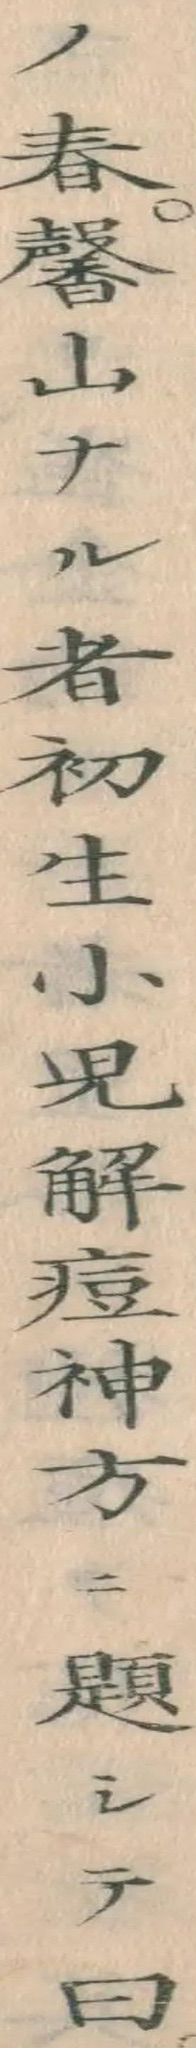ノ春。馨山ナル者初生小児解痘神方ニ題シテ曰。
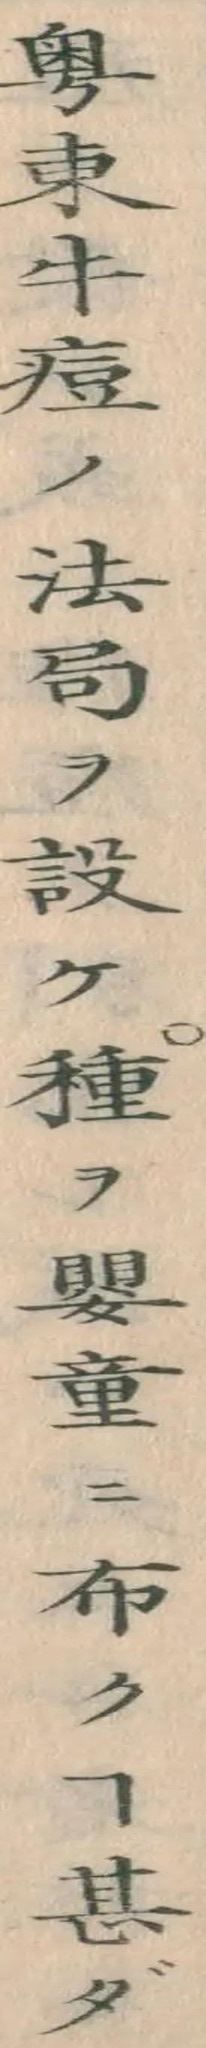粤東牛痘ノ法局ヲ設ケ。種ヲ嬰童ニ布クヿ甚ダ
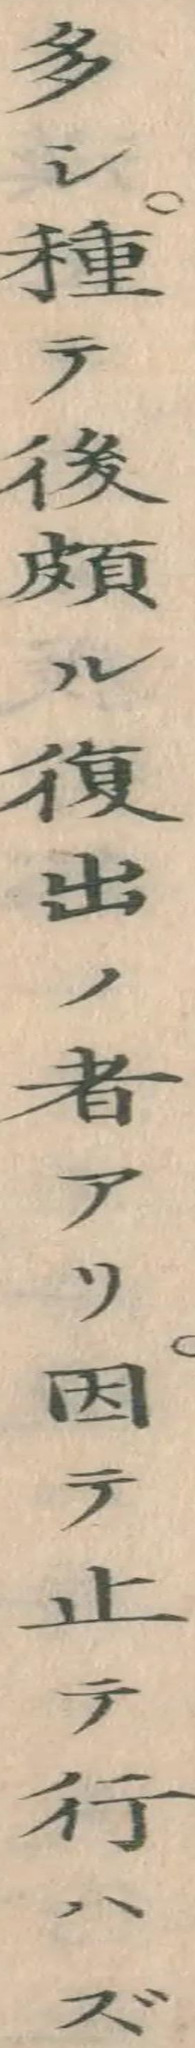多シ。種テ後頗ル復出ノ者アリ。因テ止テ行ハズ

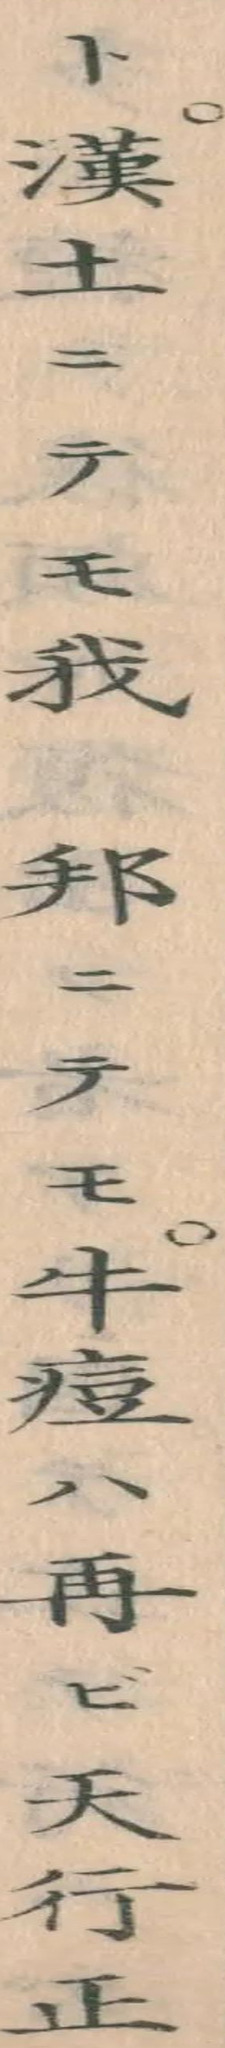ト。漢土ニテモ我邦ニテモ。牛痘ハ再ビ天行正
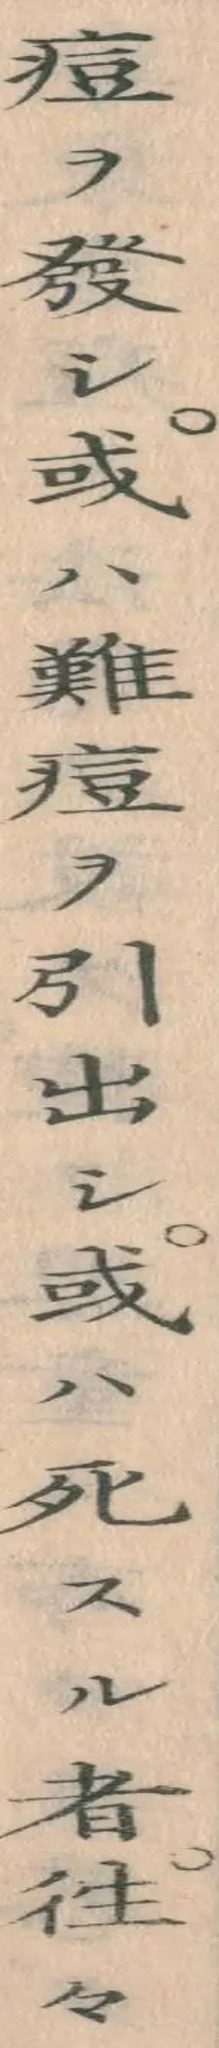痘ヲ発シ。或ハ難痘ヲ引出シ。或ハ死スル者。往々
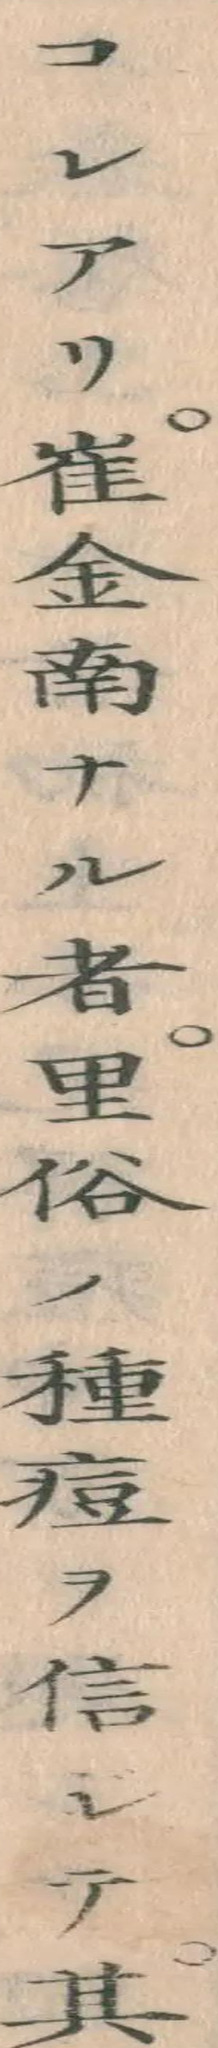コレアリ。崔金南ナル者。里俗ノ種痘ヲ信ジテ。其
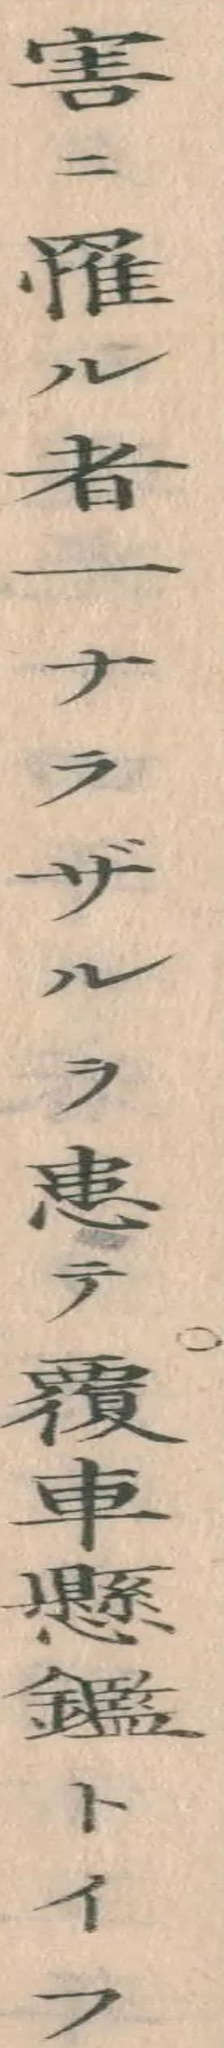害ニ罹ル者一ナラザルヲ患テ。覆車懸鑑トイフ
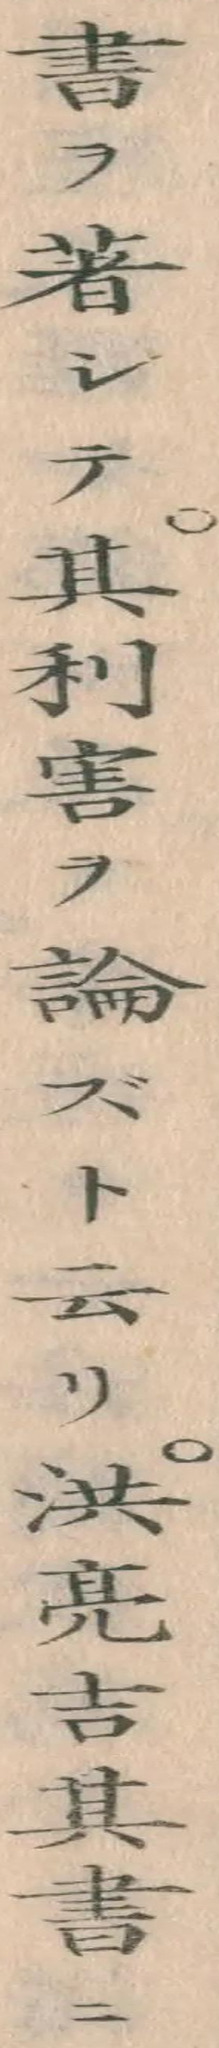書ヲ著シテ。其利害ヲ論ズト云リ。洪亮吉其書ニ
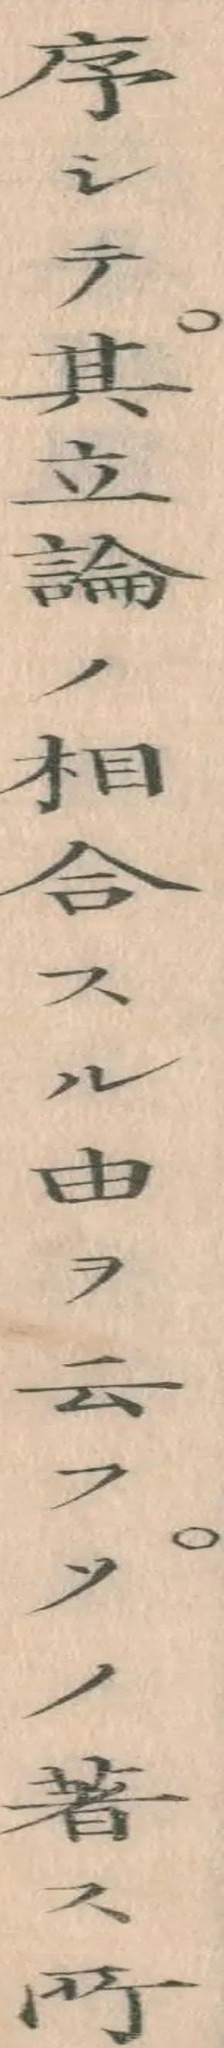序シテ。其立論ノ相合スル由ヲ云フ。ソノ著ス所
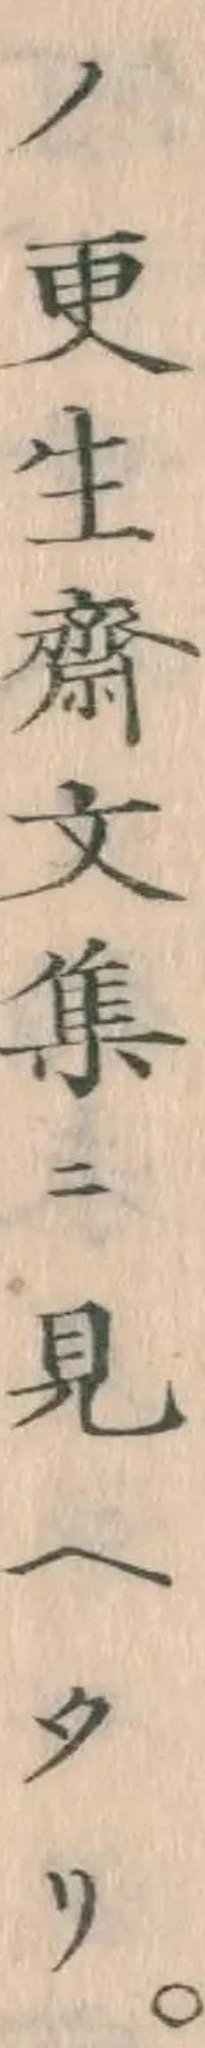ノ更生斎文集ニ見ヘタリ。
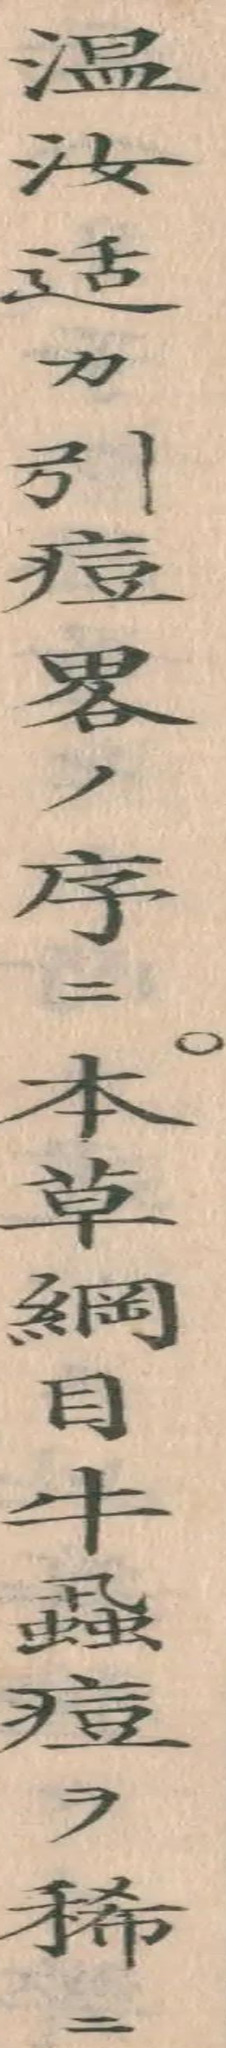温汝适カ引痘略ノ序ニ。本草綱目牛蝨痘ヲ稀ニ
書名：種痘弁義
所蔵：国立国会図書館 National Diet Library, JAPAN
